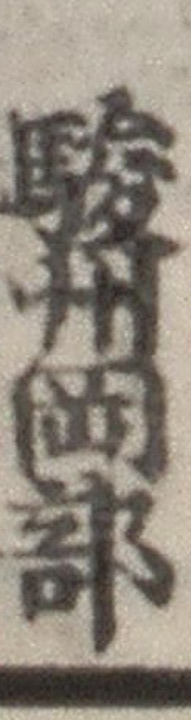駿州岡部
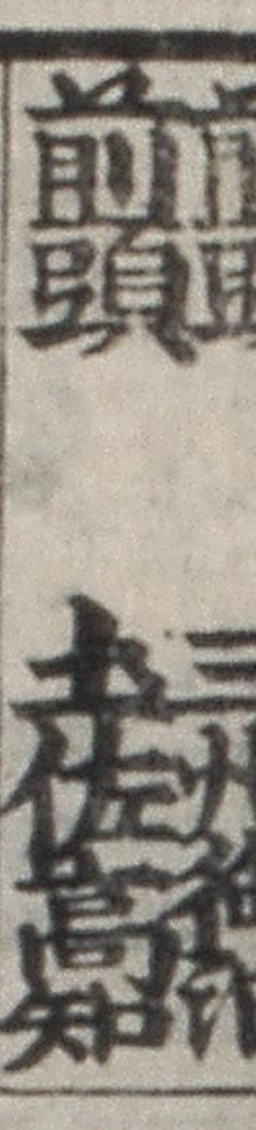前頭土佐高知
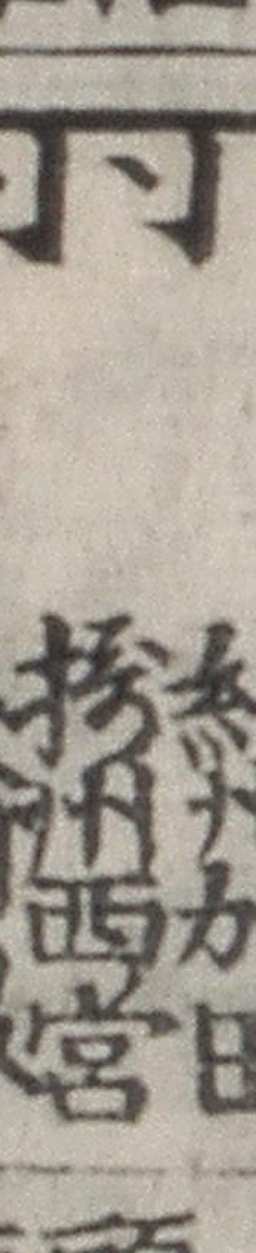同摂州西宮
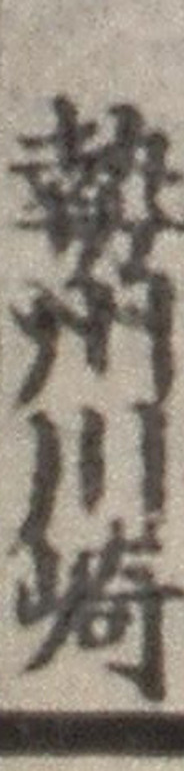勢州川崎
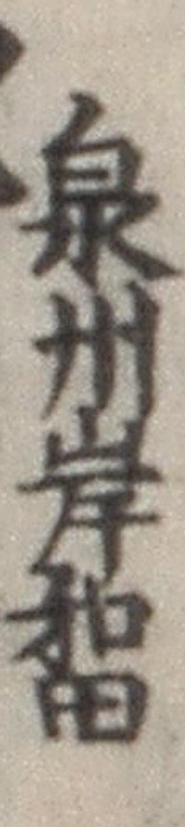泉州岸和田
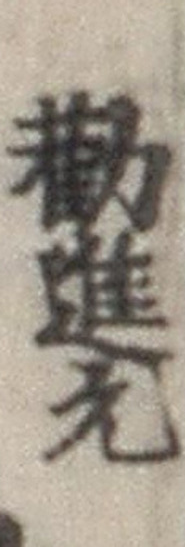勧進元
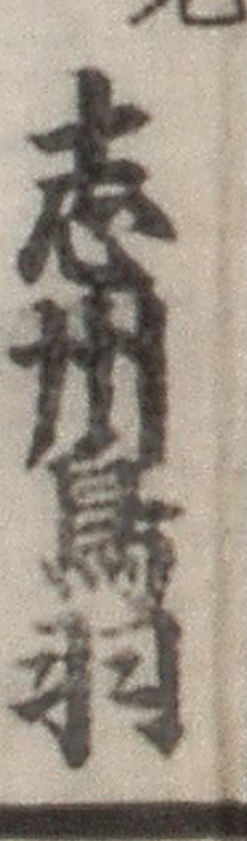志州鳥羽
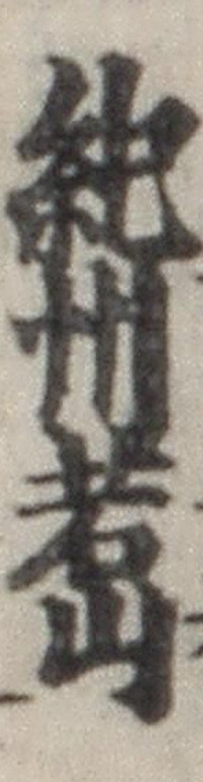紀州若山
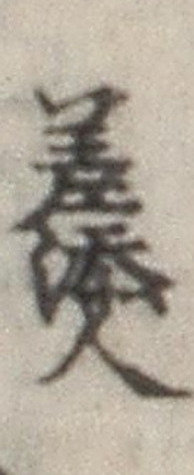差添人
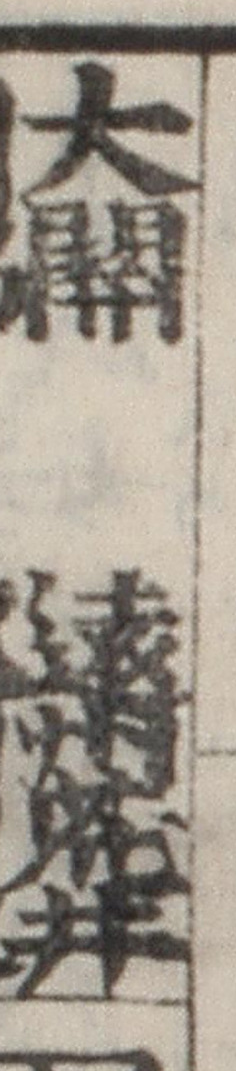大関遠州荒井
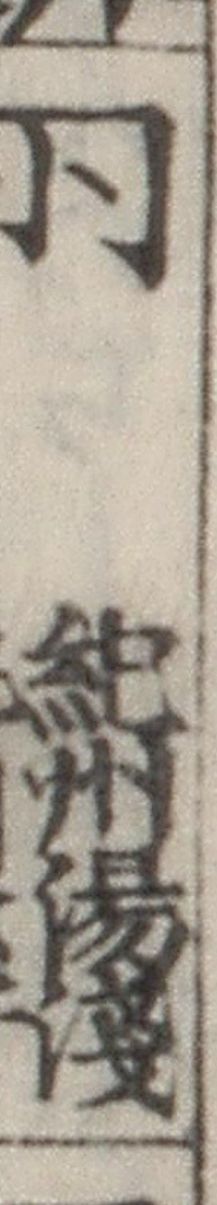同紀州湯浅
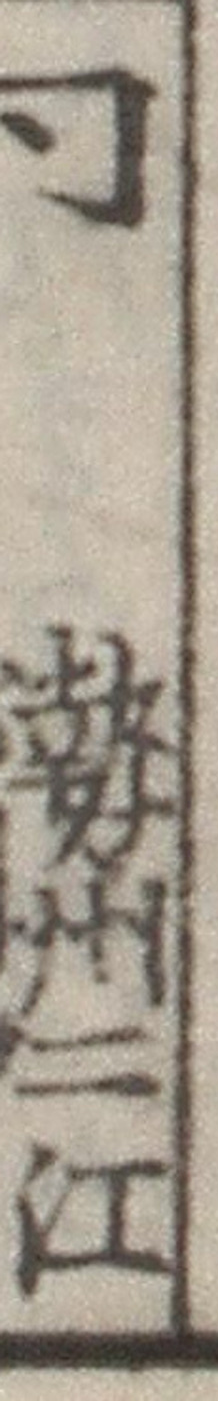同勢州二江
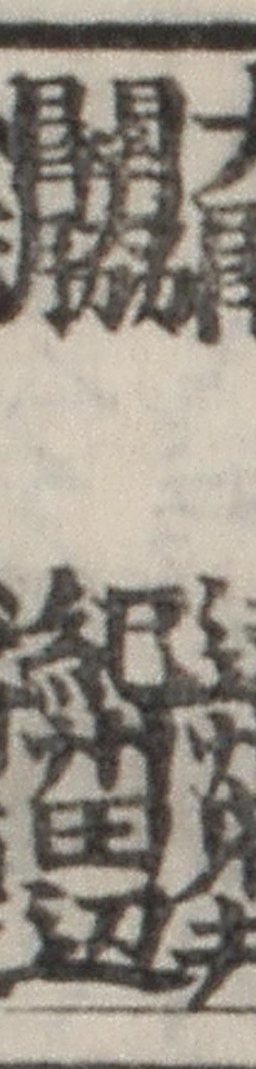関脇紀州田辺
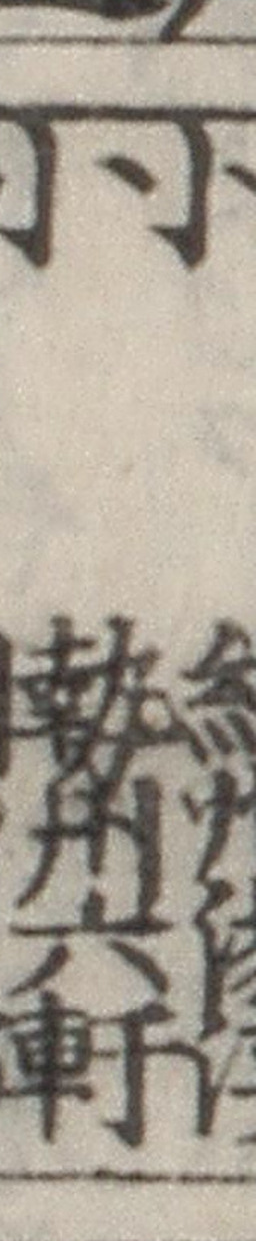同勢州六軒
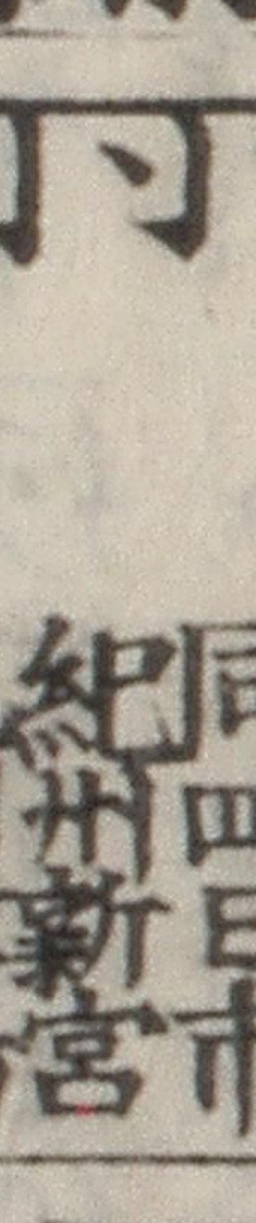同紀州新宮
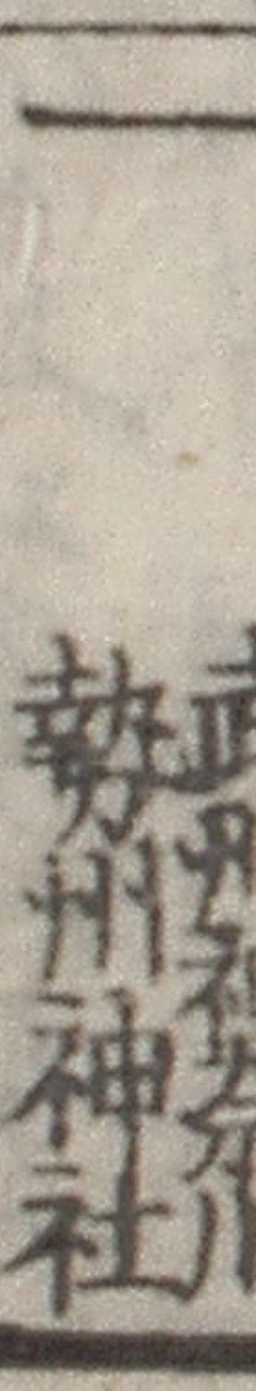同伊州神社
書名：諸國大地震年代記　末代噺種
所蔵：東京大学地震研究所図書室 Earthquake Research Institute Library, The University of Tokyo, JAPAN
